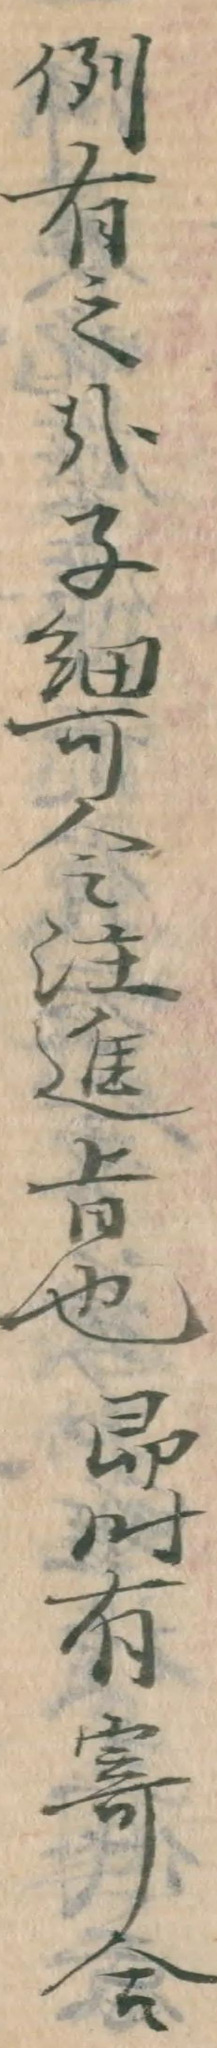例有之哉子細可令注進旨也即時有寄合
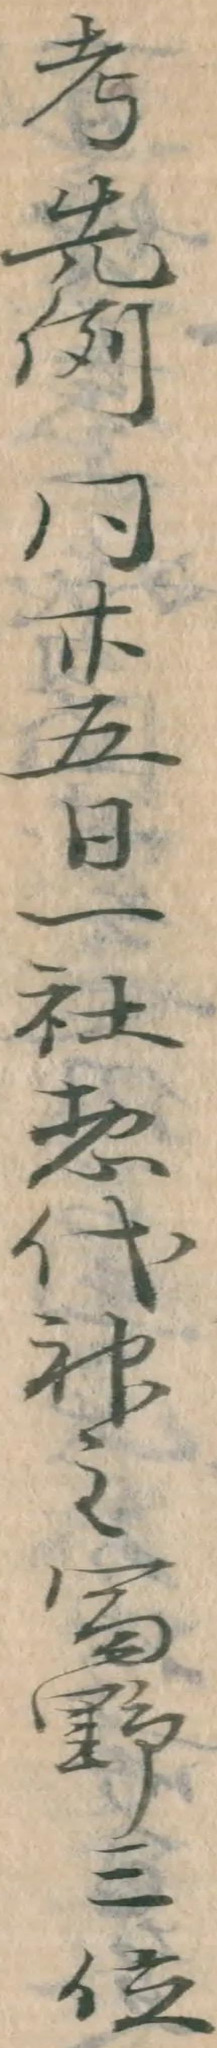考先例同廿五日一社惣代神主冨野三位
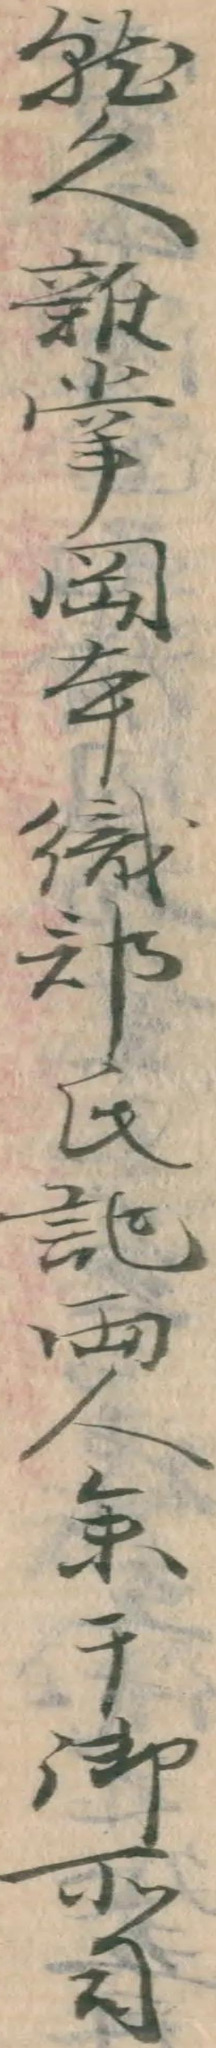就久雑掌岡本織部氏記両人参于御所司
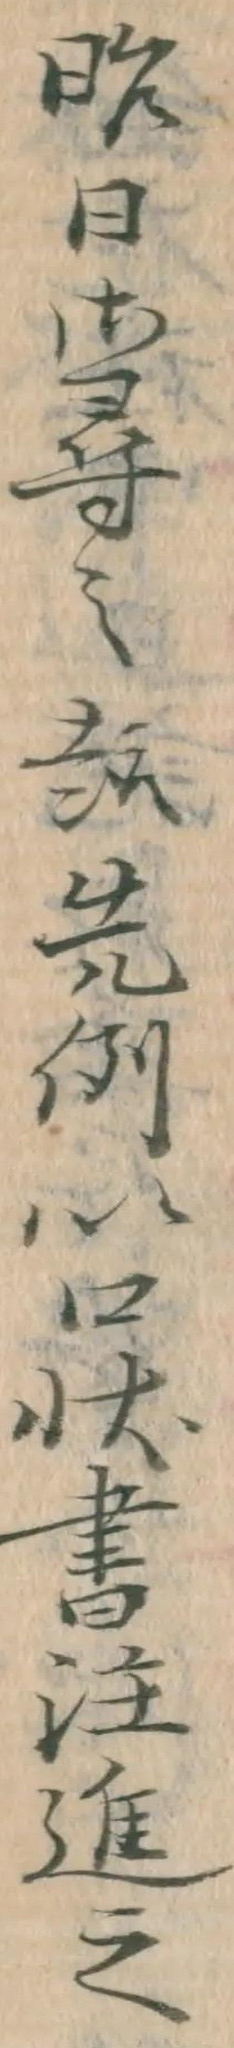昨日御尋之趣先例以口状書注進之
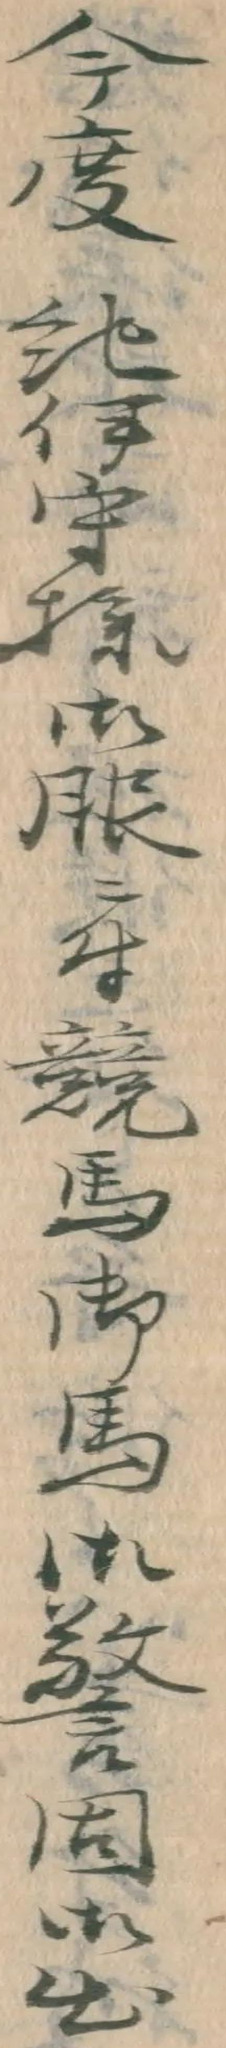今度紀伊守様御服ニ付競馬御馬御警固御出
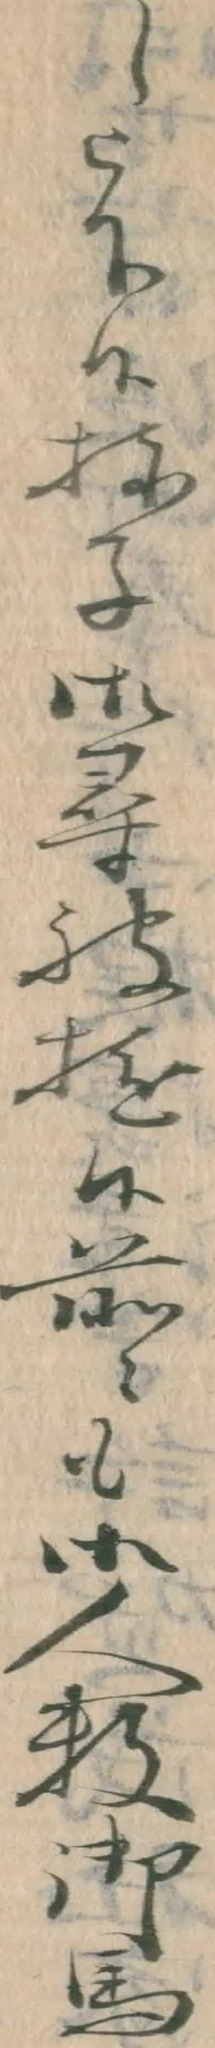し被下候様子御尋被遊候前々も御人数御馬
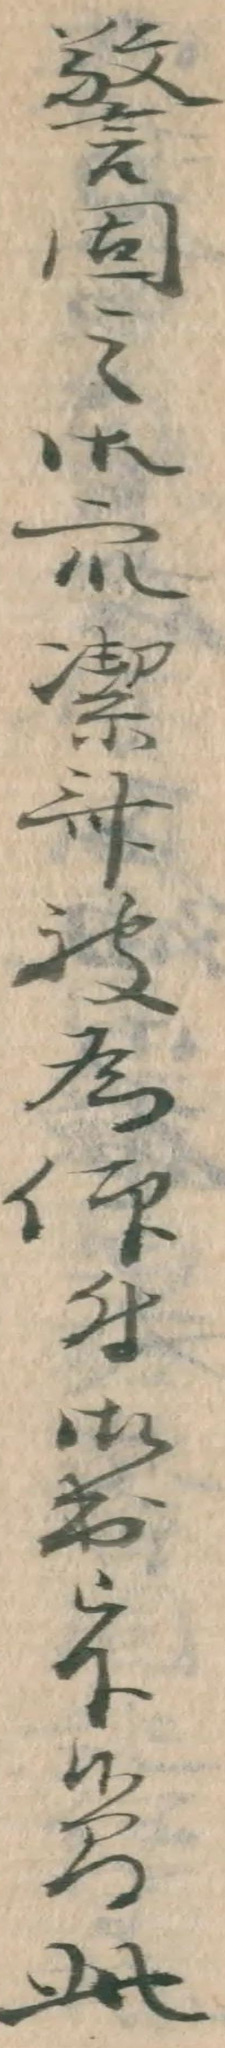警固之御衆潔斎被為仰付御出被下候間此
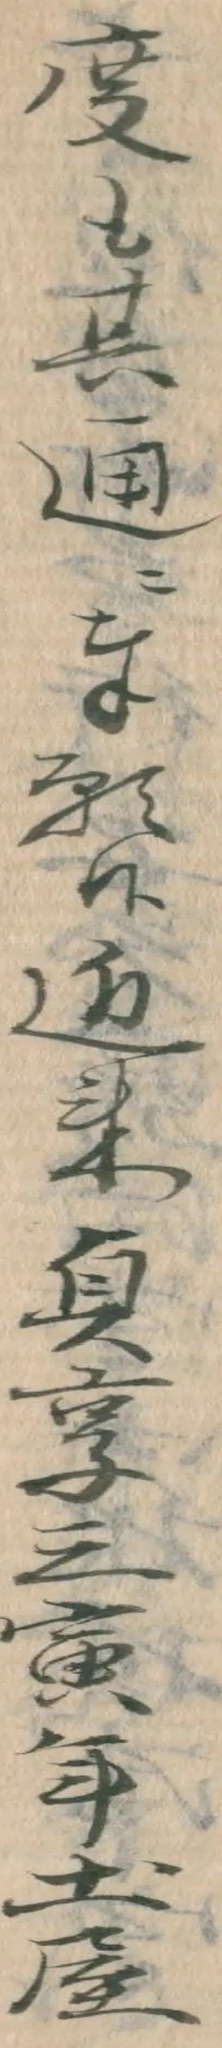度も其通ニ奉願候近来貞享三寅年土屋
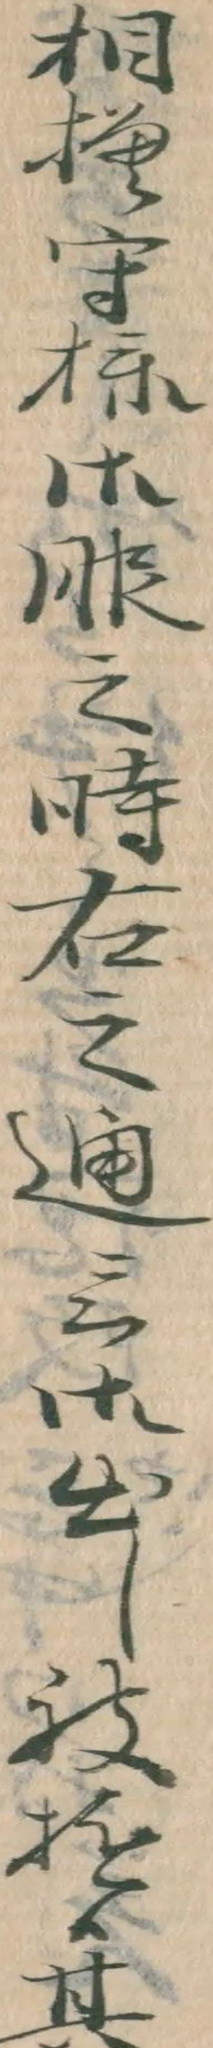相模守様御服之時右之通ニ而御出し被遊候其
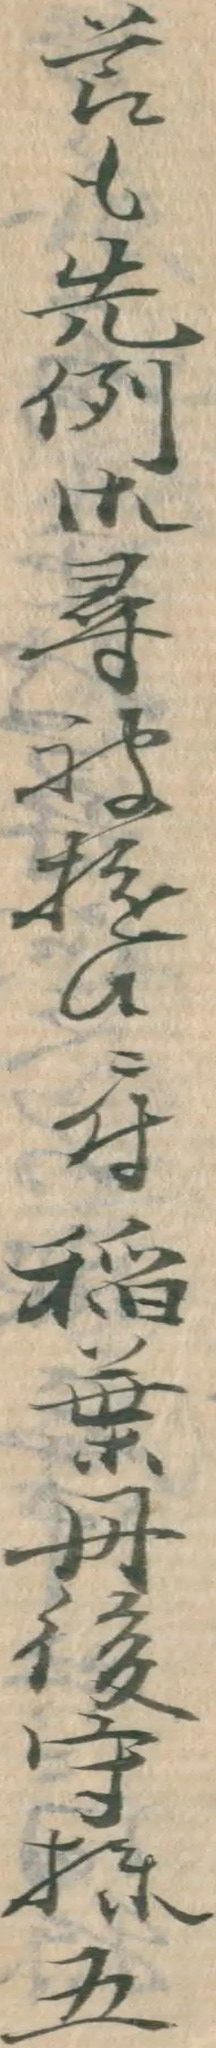節も先例御尋被遊候ニ付稲葉丹後守様五
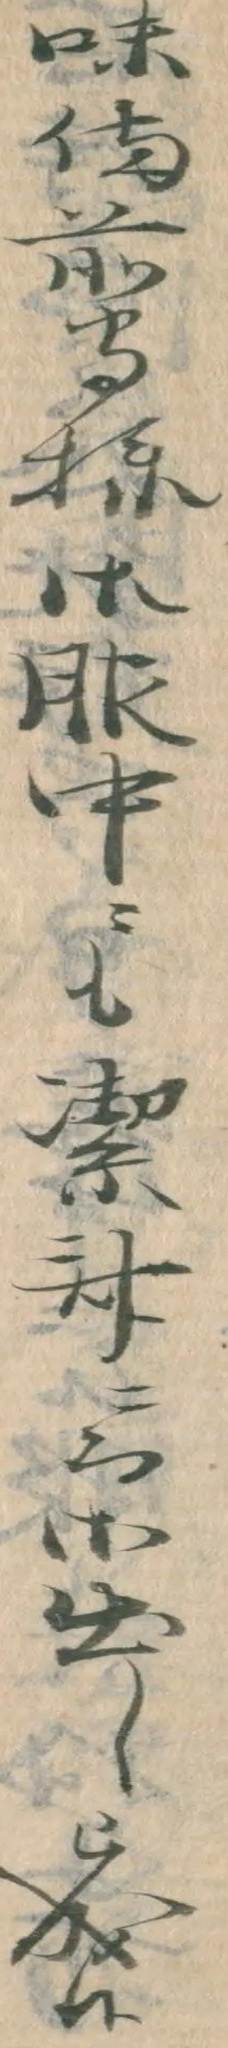味備前守様御服中ニも潔斎ニ而御出し被成候
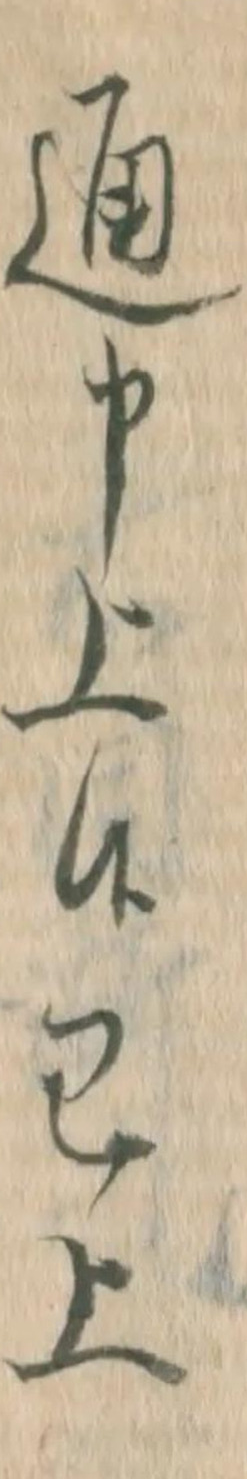通申上候已上
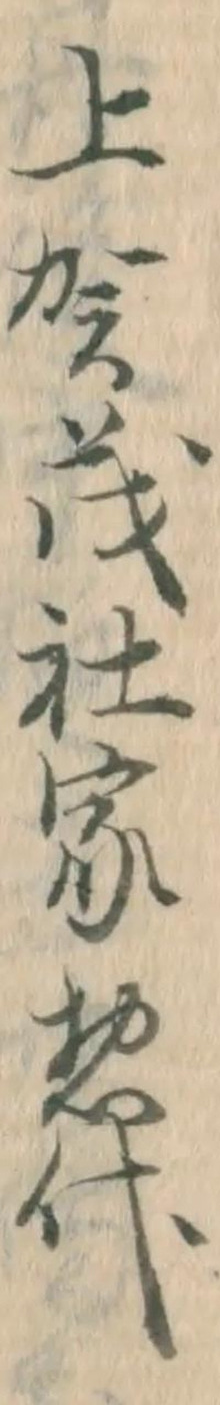上賀茂社家惣代
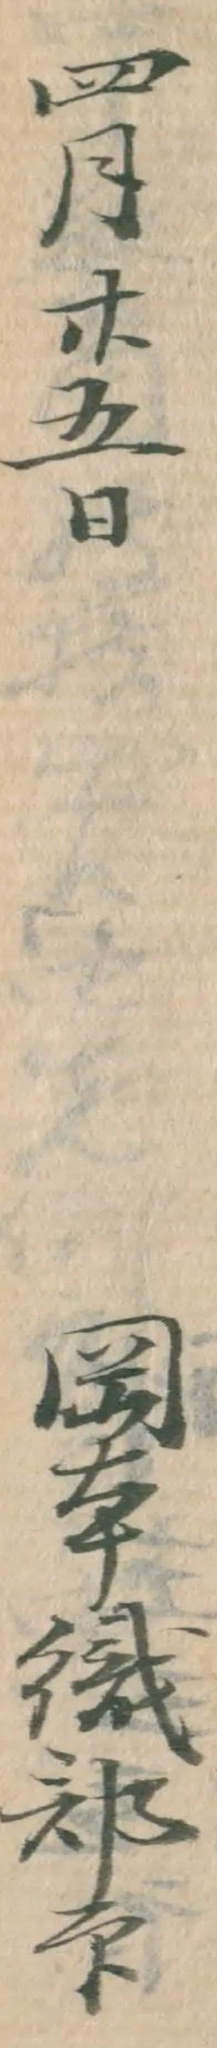四月廿五日岡本織部印

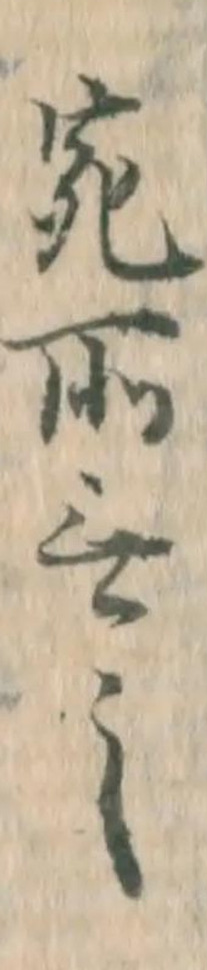宛所無之
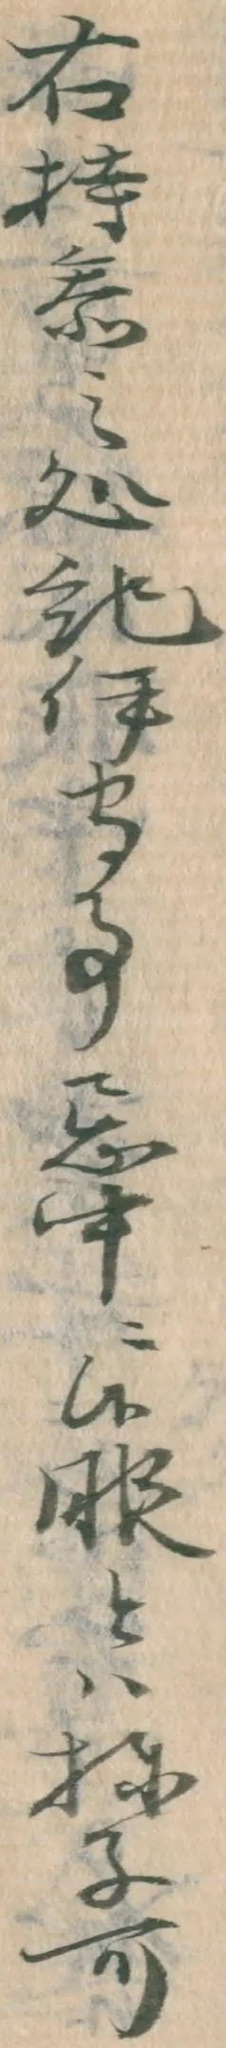右持参之処紀伊守事忌中ニ候服とハ様子可
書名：賀茂社記録. 第10冊
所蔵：国立国会図書館 National Diet Library, JAPAN
